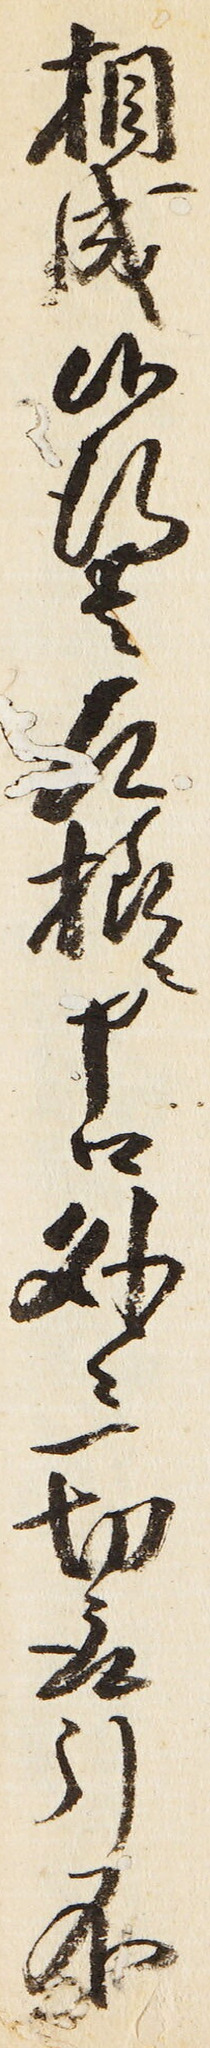相成候得者左様ニ申口外ニ一切取引不
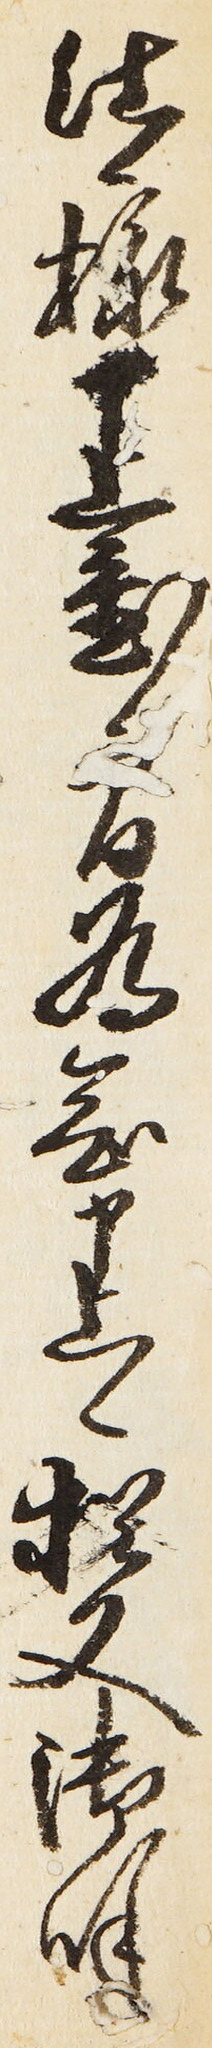仕候様申上置候間為念申上候猶又御呼
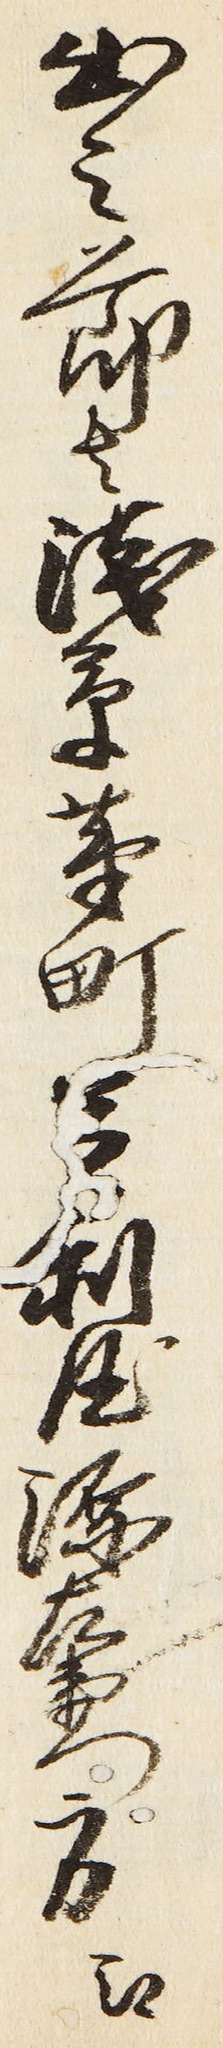出之節者浅草茅町足利屋源左衛門方江
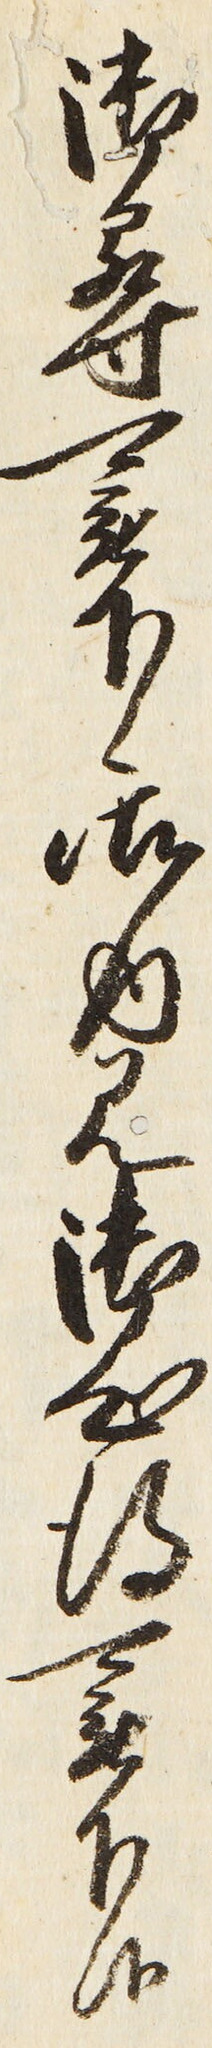御尋可被成候御内見御心得可被下候
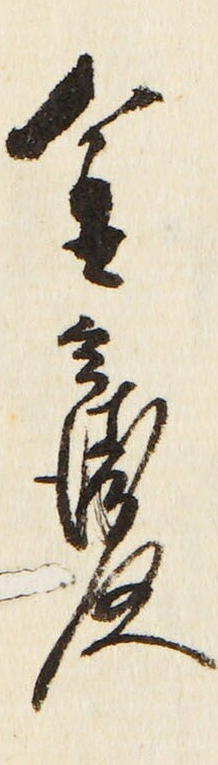金兵衛殿

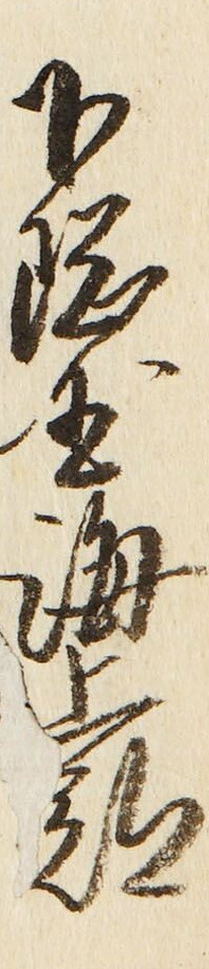下総国海上郡
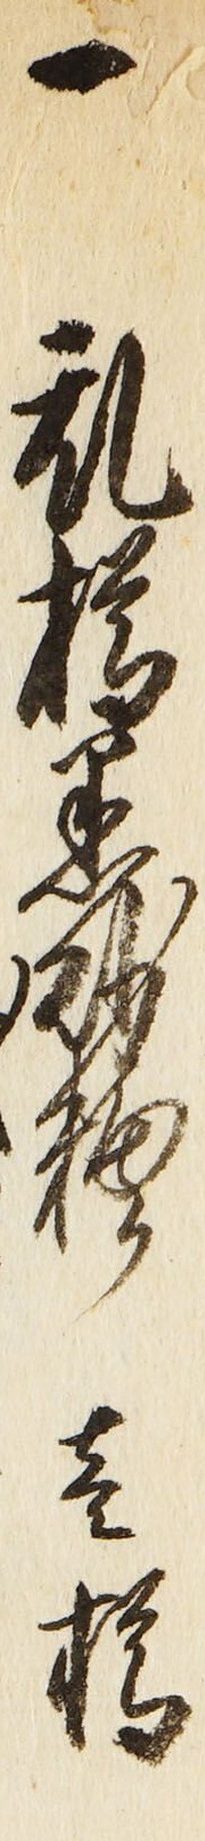一乱樽黒砂糖壱樽
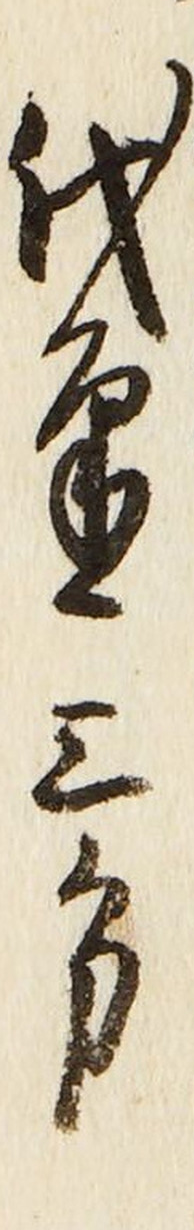代金三分
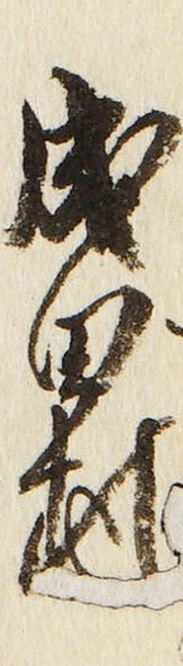成田村
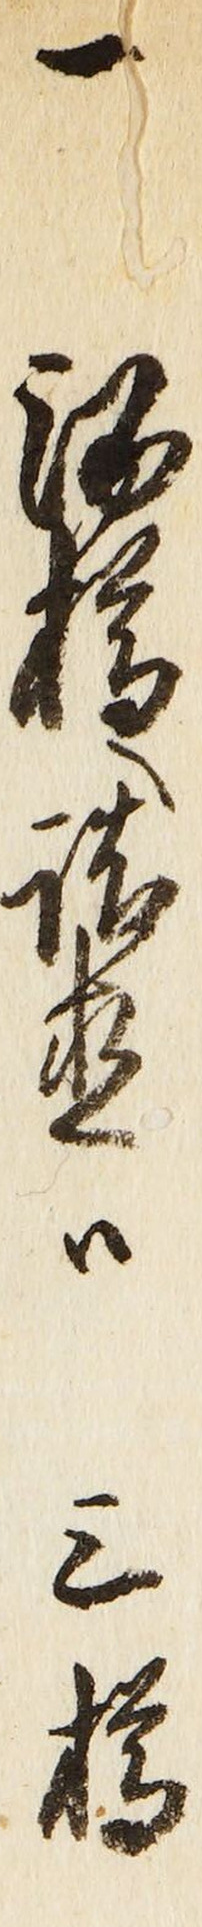一酒樽へ詰直ハ三樽
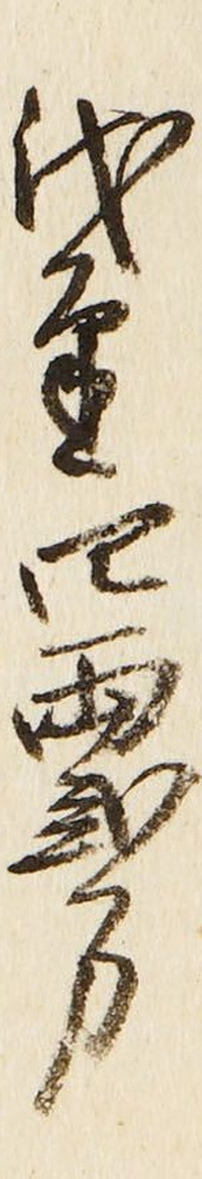代金四両弐分
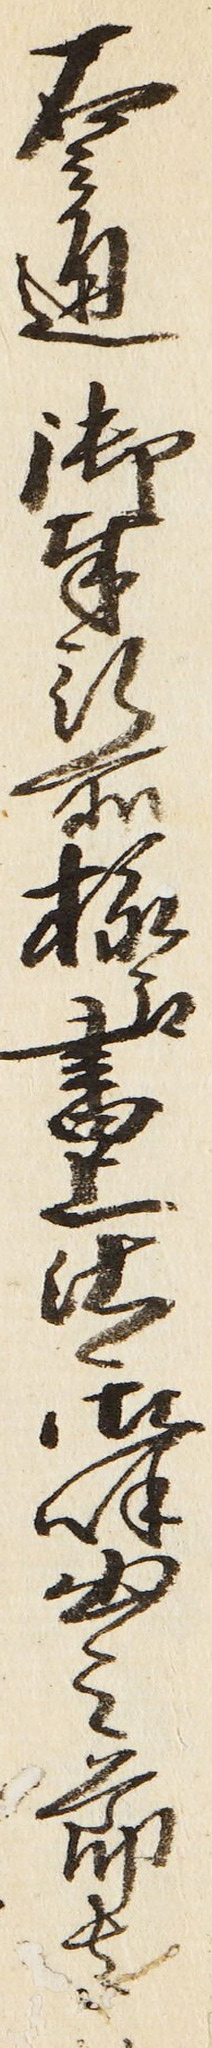右之通御奉行所様江書上仕候御呼出之節者
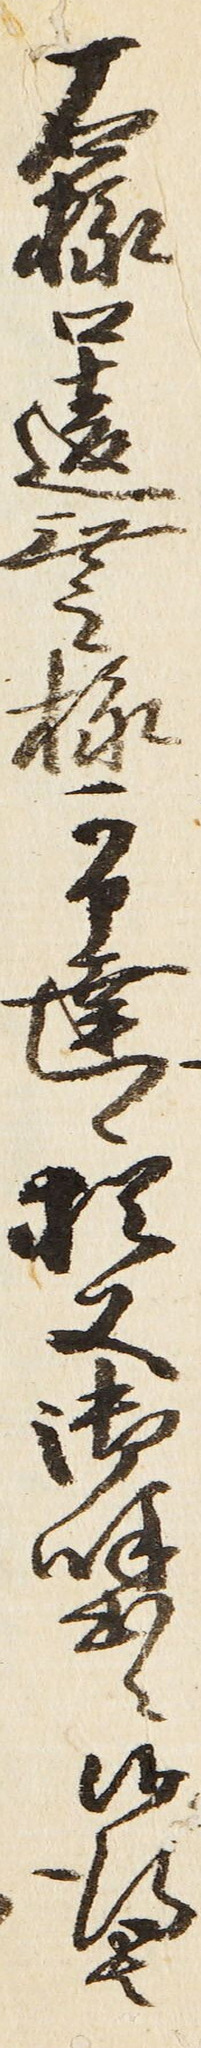右様口違無之様可申達候猶又御呼出ニ候得者
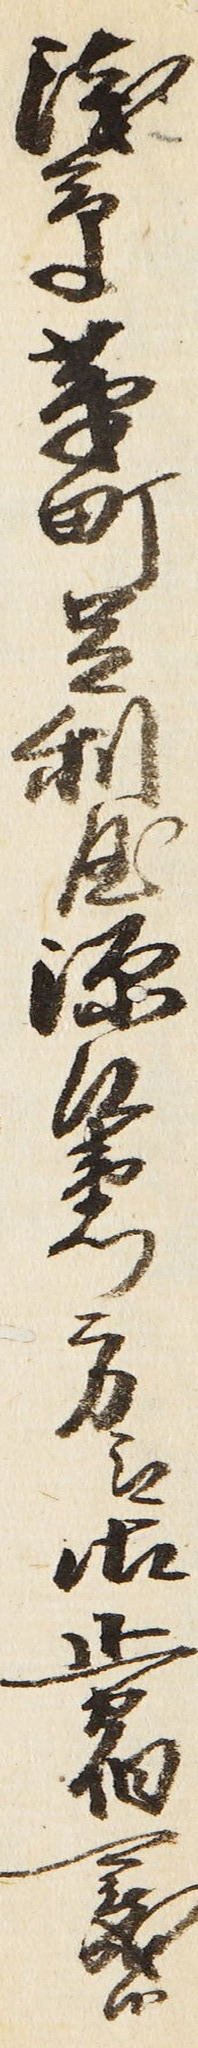浅草茅町足利屋源左衛門方江御止宿可被成候
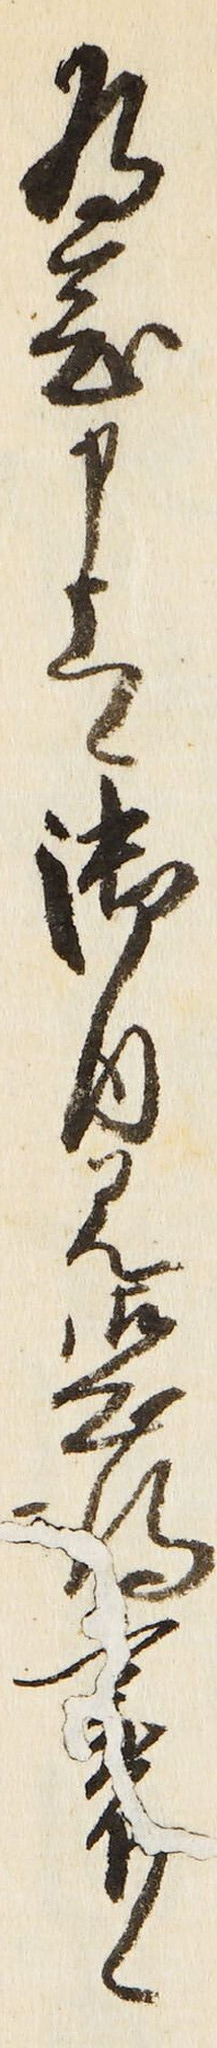為念申上候御内見御心得可被下候
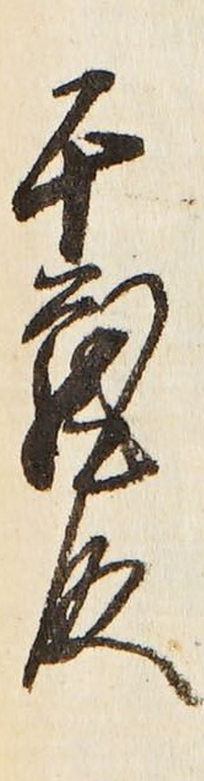千蔵殿
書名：難船一件記録
